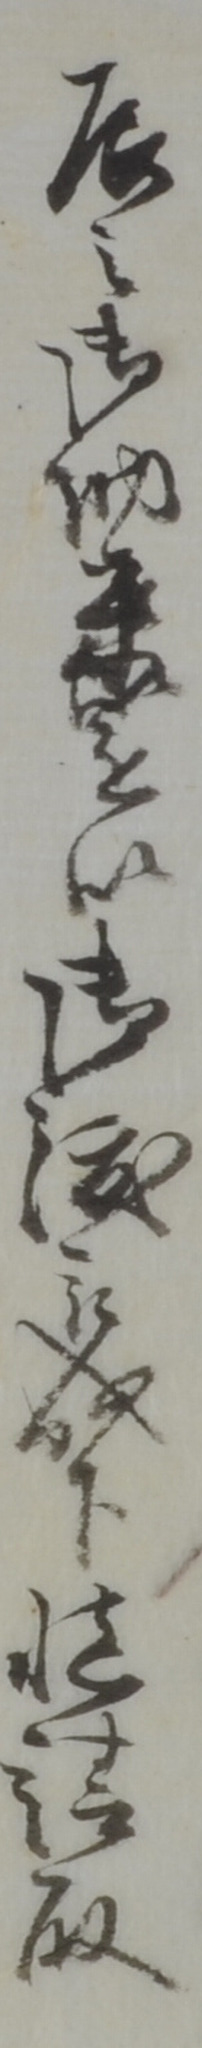辰之御助米を以御渡被成下慥請取
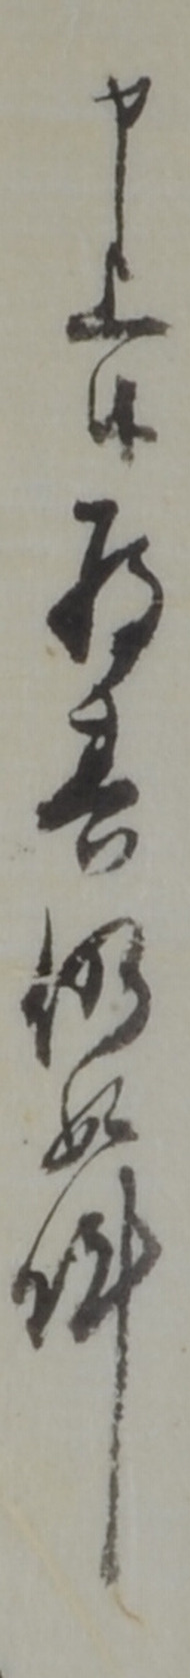申上候為其仍如件
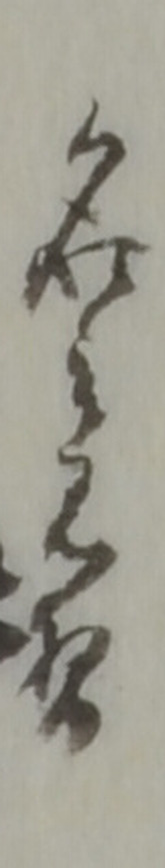名主見習
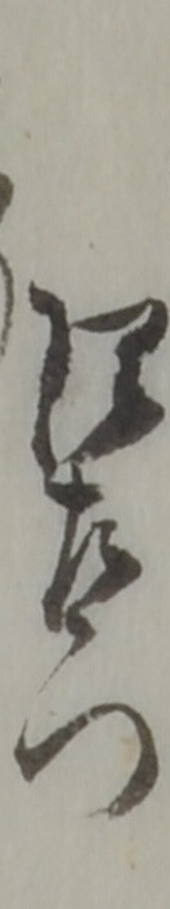理左衛門
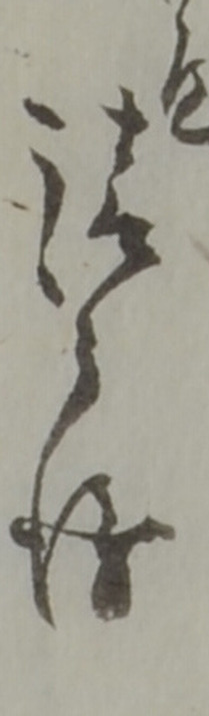清兵衛
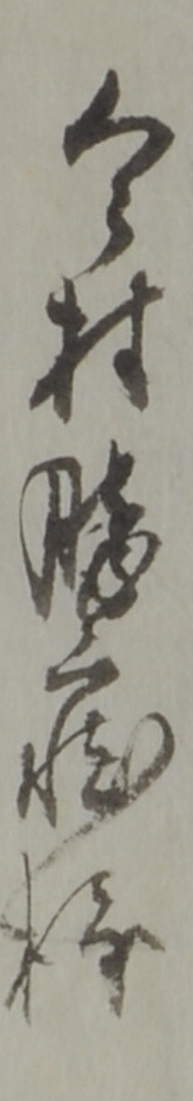今村勝蔵様
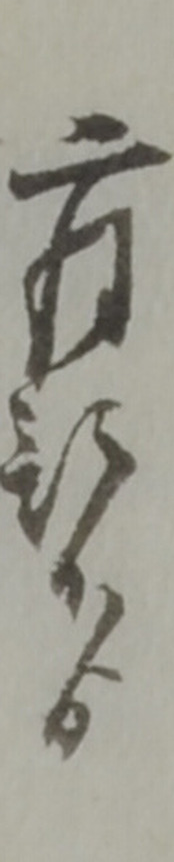二月朔日ゟ
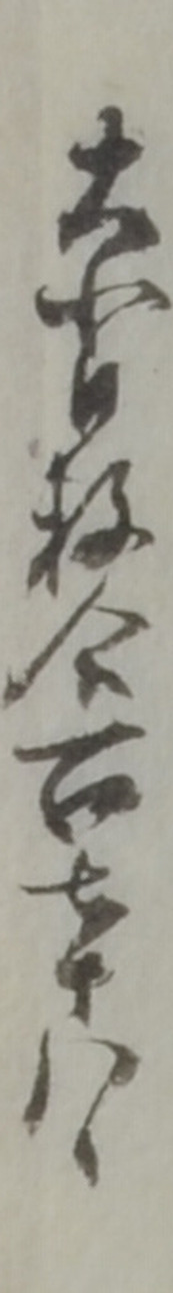大小日数合百七十八日

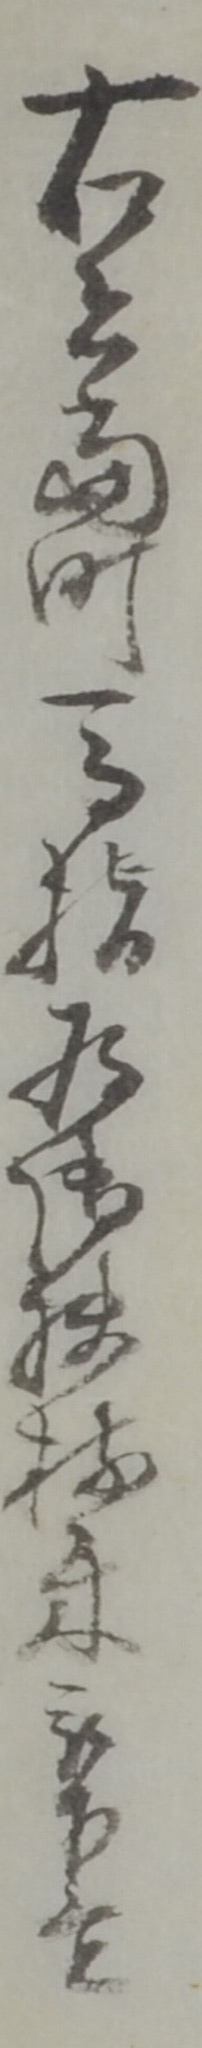右者当町高指為御扶持米被下置
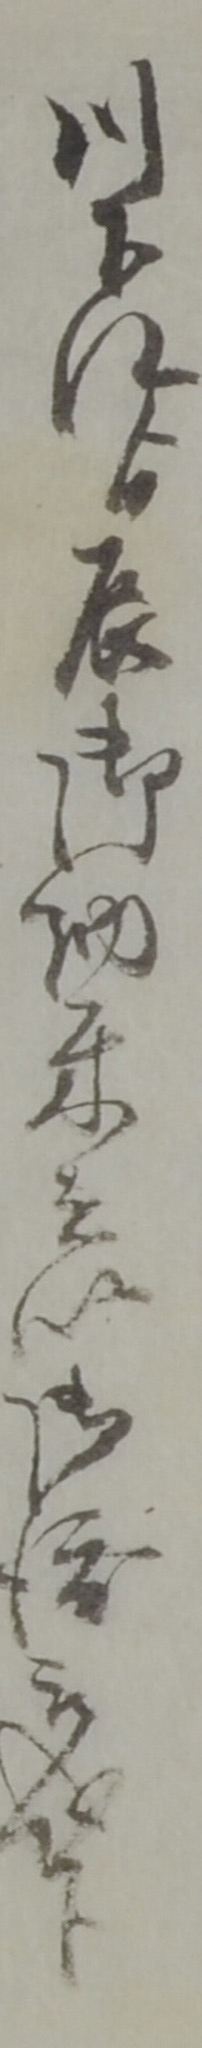川下郷ゟ辰御納米を以御渡被成下
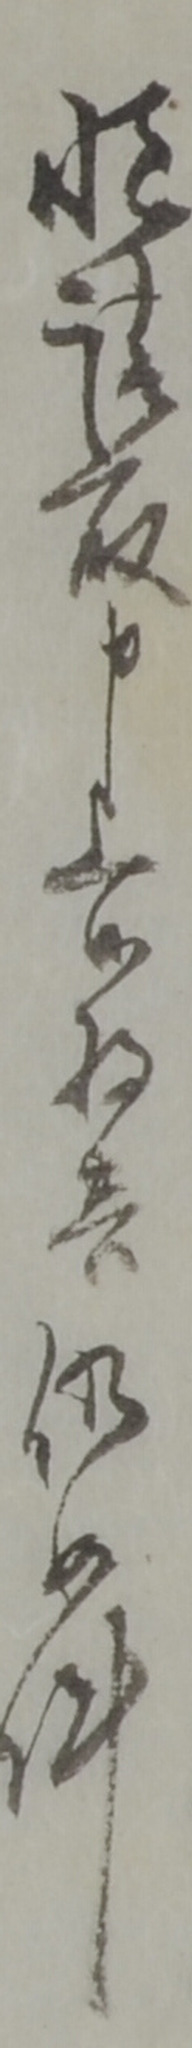慥請取申上候将喜仍如件
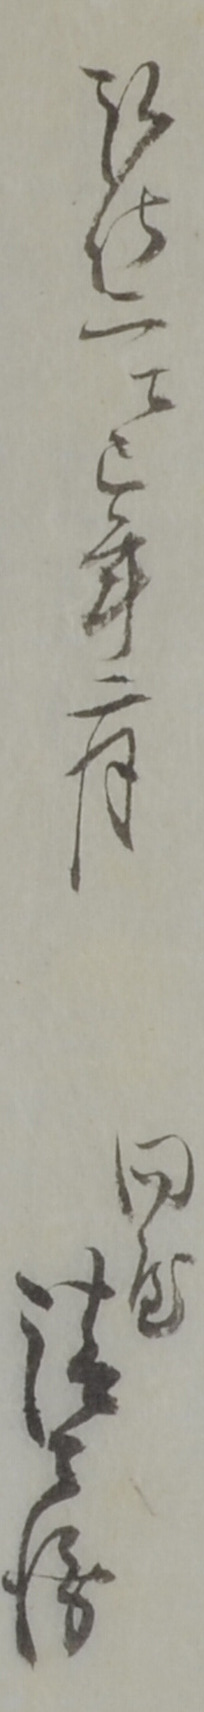弘化二乙巳年二月清兵衛
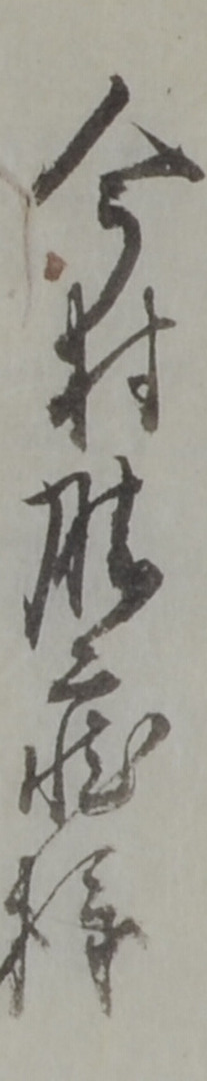今村勝蔵様
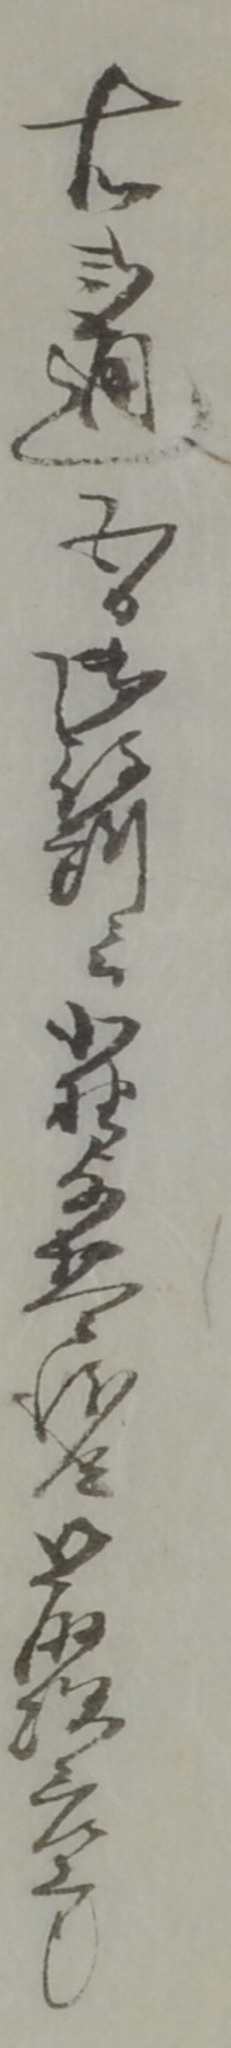右弐通五日御役所ニ而北野与惣兵衛殿御取次差上申候
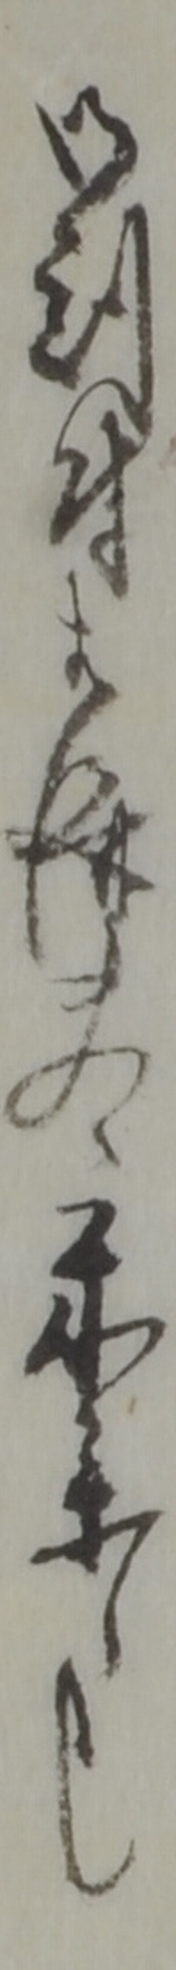御刻付相渡各夫々米参申候
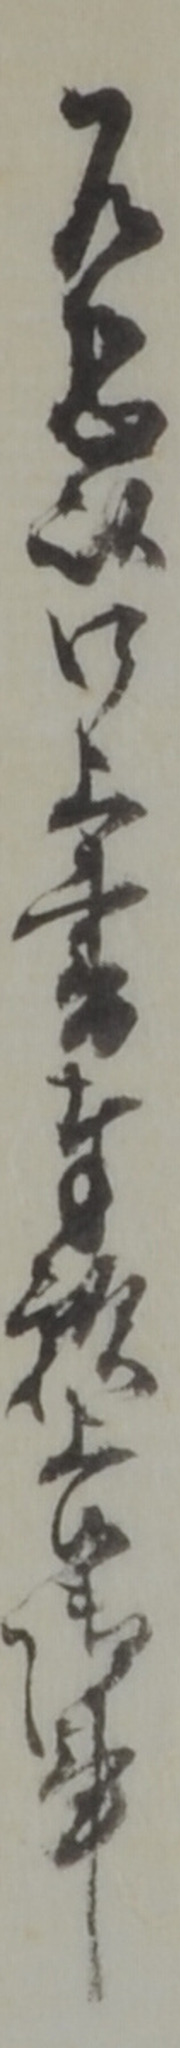乍恐以口上書奉願上候御事
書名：諸願書控簿
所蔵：伊那市立高遠町図書館・合同会社AMANE
